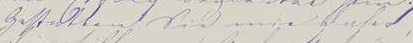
Gestatten Sie mir daher,
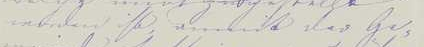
worden ist, anmit der Ge-
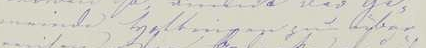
meinde Hottingen zu über-
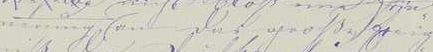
nerung an das große Ereig-
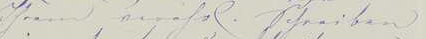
Ihrem verehrl. Schreiben
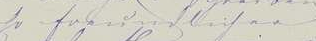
so freundlicher
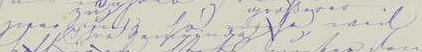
zwar zu um so mehrgrößerer, weil
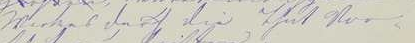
Werkes durch die That Vor-
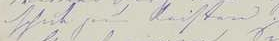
schub zu leisten.
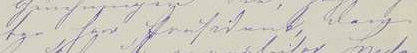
ter Herr Präsident, den
